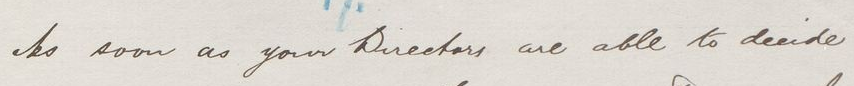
As soon as your Directors are able to decide
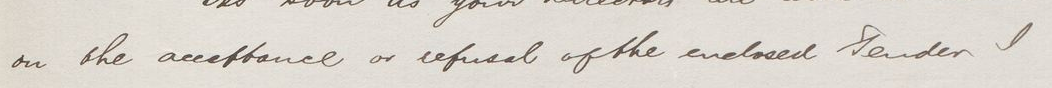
on the acceptance or refusal of the enclosed Tender I
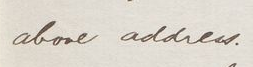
above address.
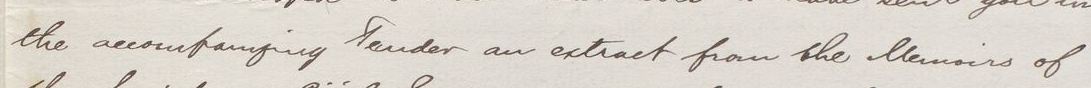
the accompanying Tender an extract from the Memoirs of
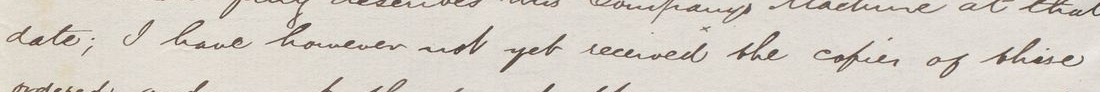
date; I have however not yet receivedx since received and sent
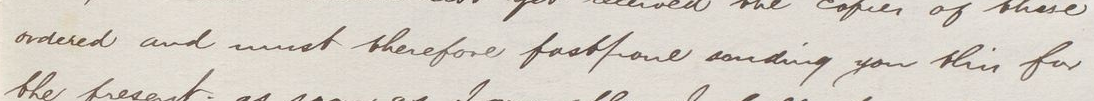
ordered and must therefore postpone sending you this for
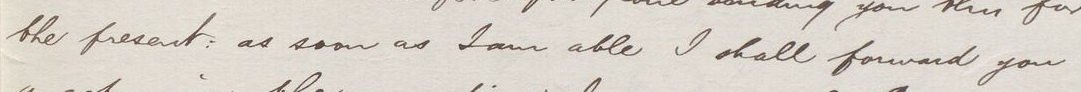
the present: as soon as I am able I shall forward you
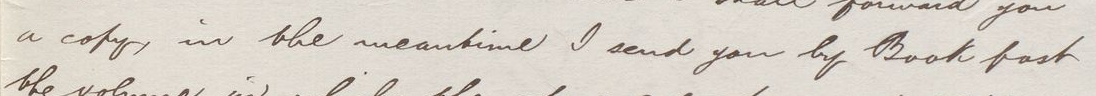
a copy, in the meantime I send you by Book post
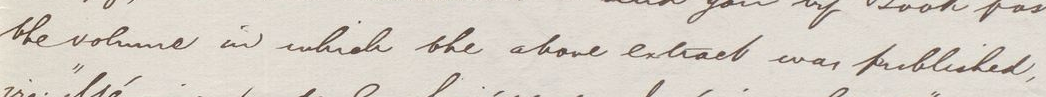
the volume in which the above extract was published,
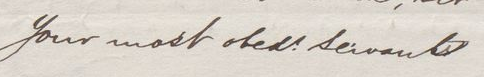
Your most obedt Servants
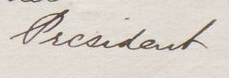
President
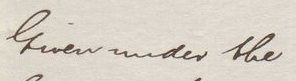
Given under the
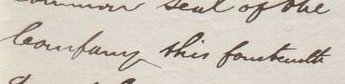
Company this fourteenth
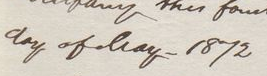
day of May–1872
